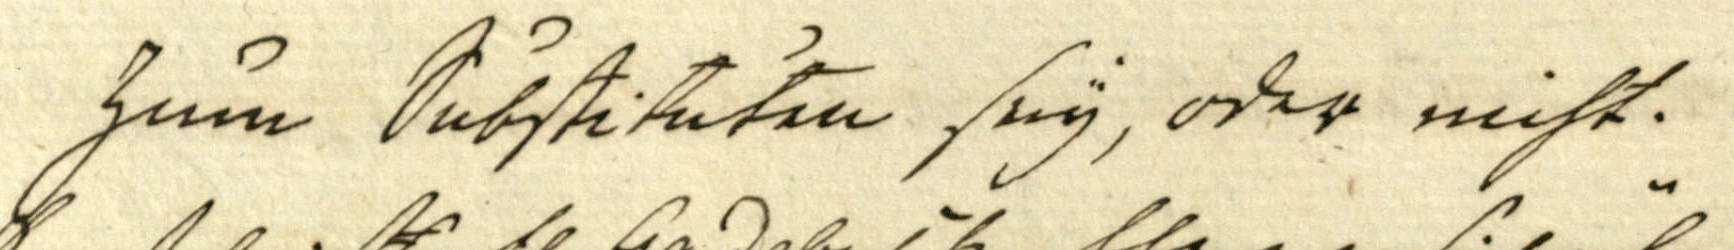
zum Substituten seÿ, oder nicht.
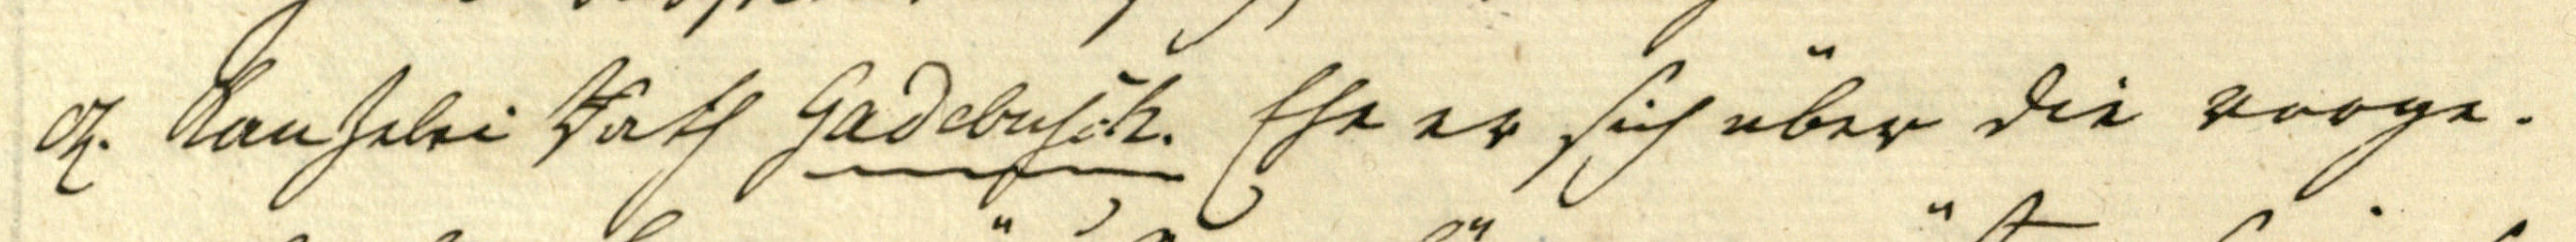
dh. Kanzelei Rath Gadebusch. Ehe er sich über die vorge¬
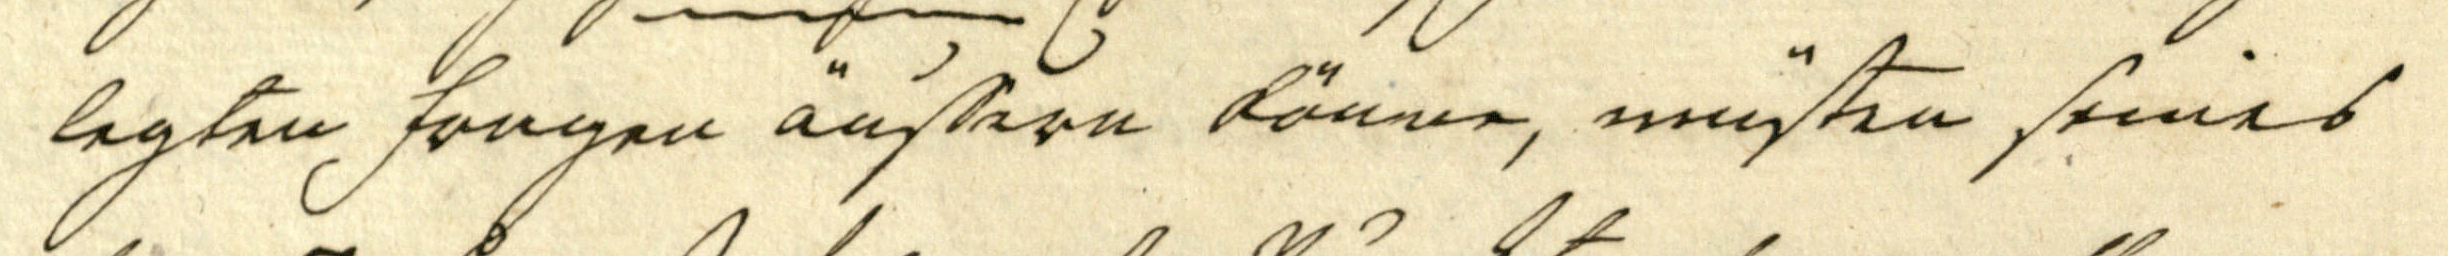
legten Fragen äussern könne, müsten seines
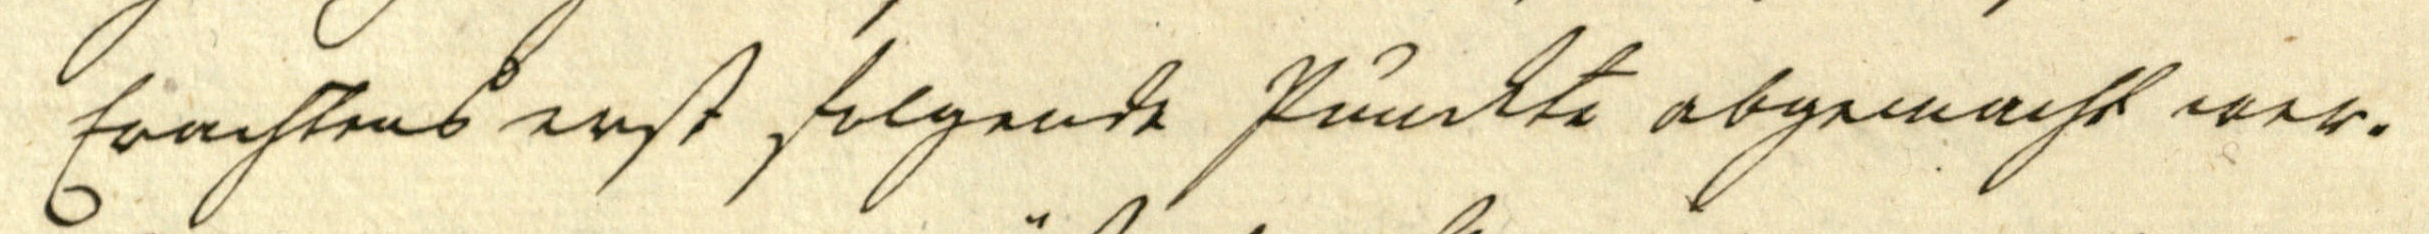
Erachtens erst folgende Punckte abgemacht wer¬
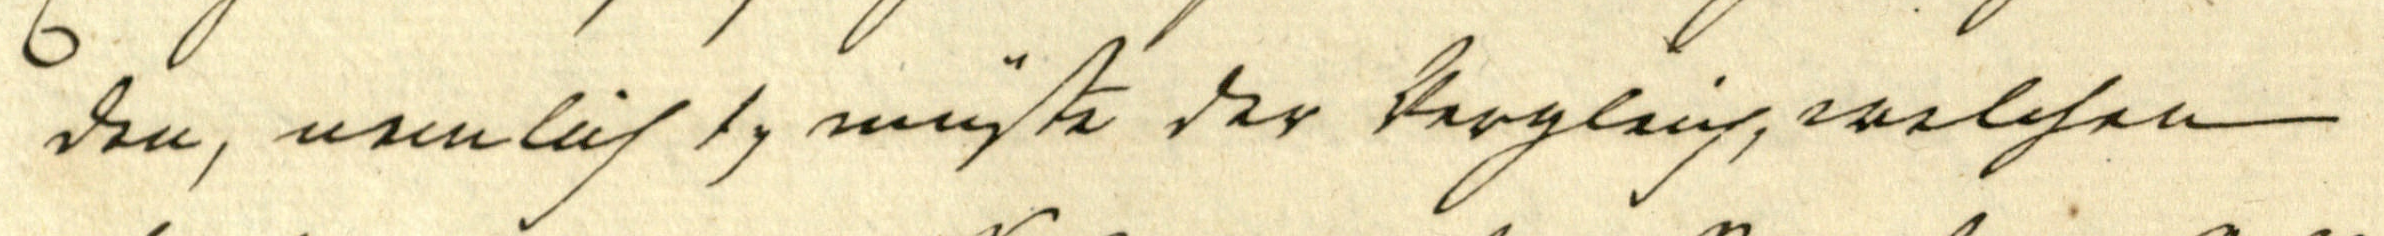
den, nemlich 1, müste der Vergleich, welchen
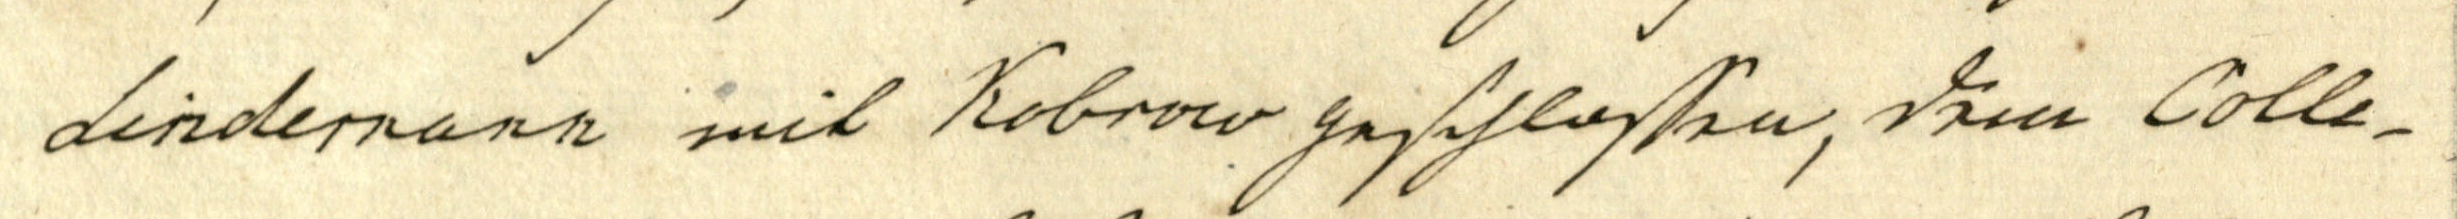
Lindemann mit Kobrow geschlossen, dem Colle¬
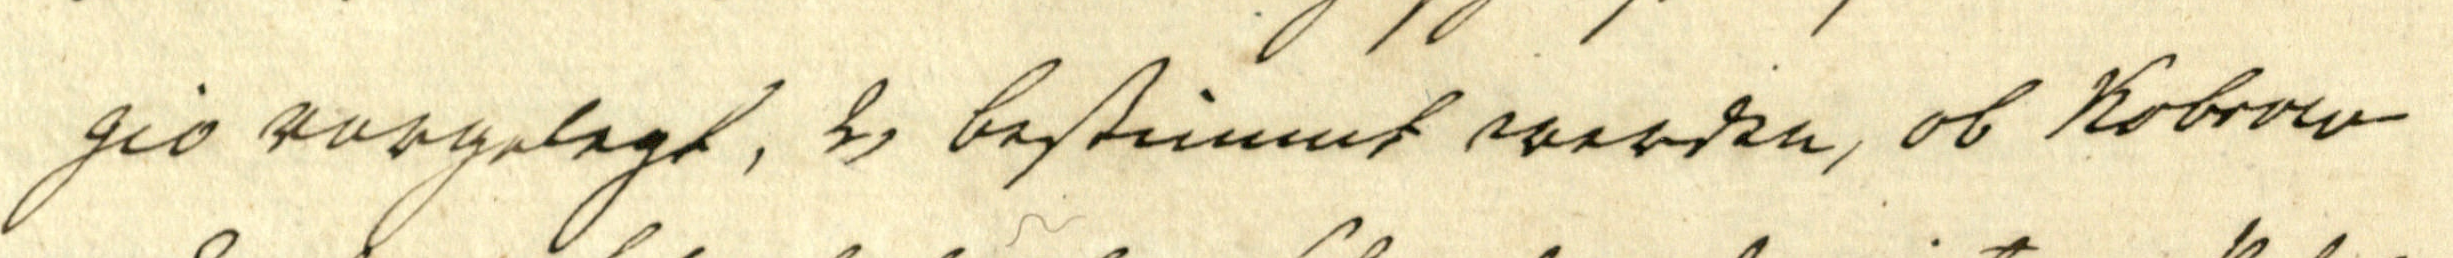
gio vorgelegt, 2, bestimmt werden, ob Kobrow
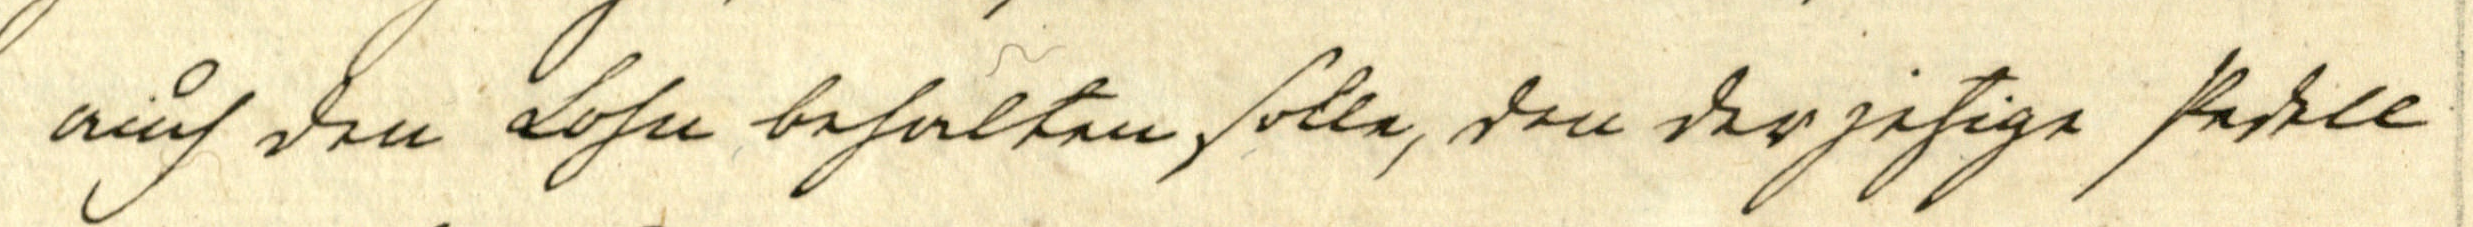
auch den Lohn behalten solle, den der jetzige Pedell
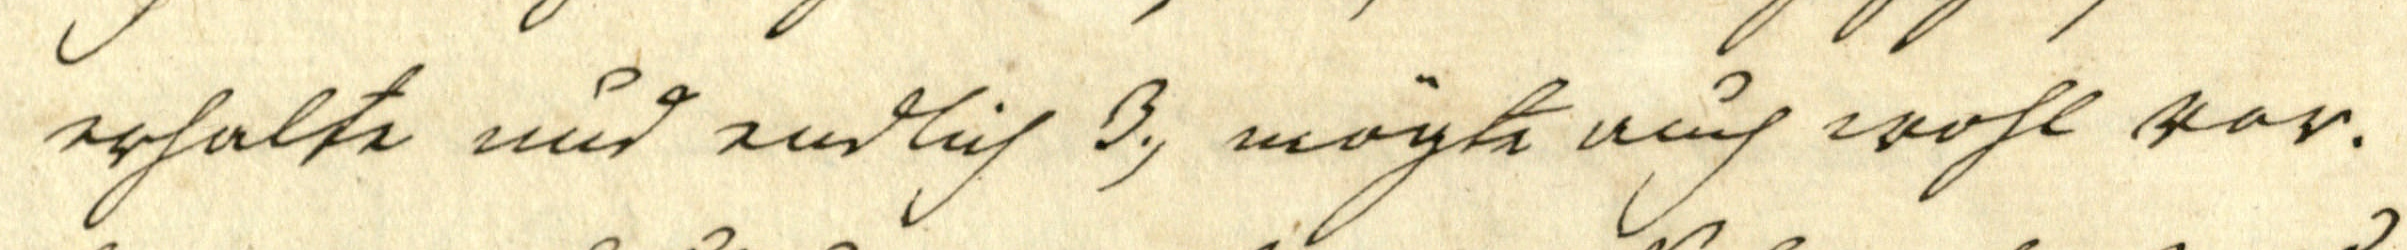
erhalte und endlich 3., mögte auch wohl vor¬
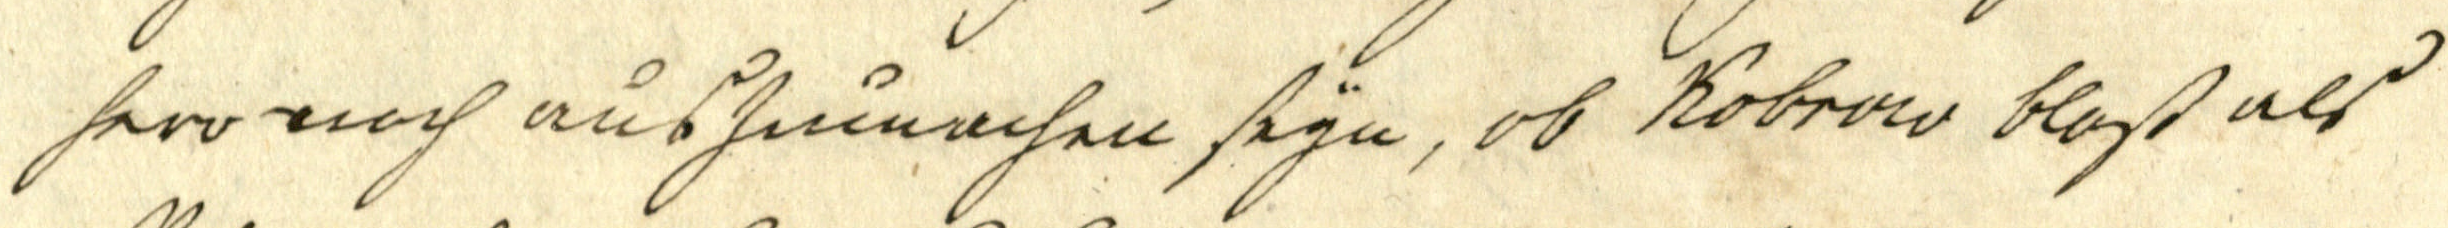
hero noch auszumachen seÿn, ob Kobrow bloß als
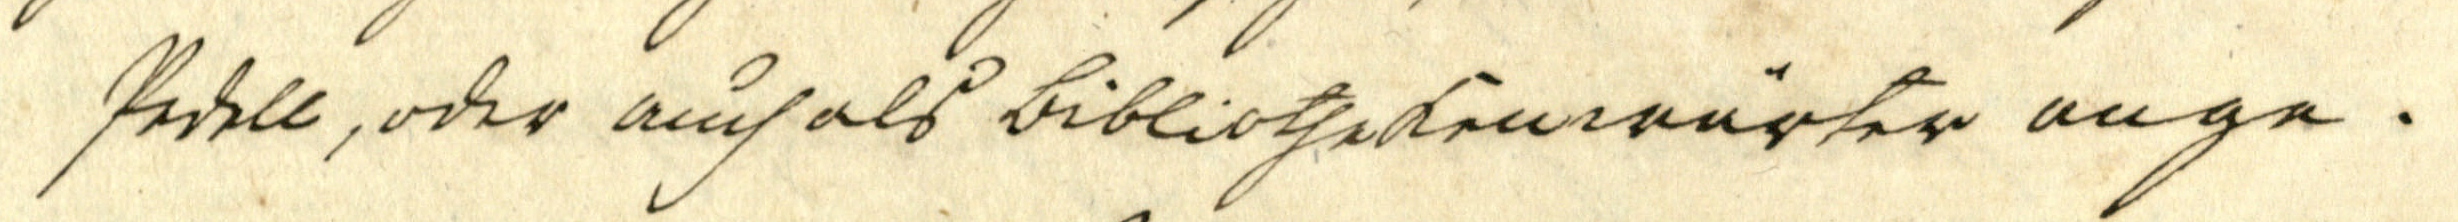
Pedell, oder auch als Bibiothekenwärter ange¬
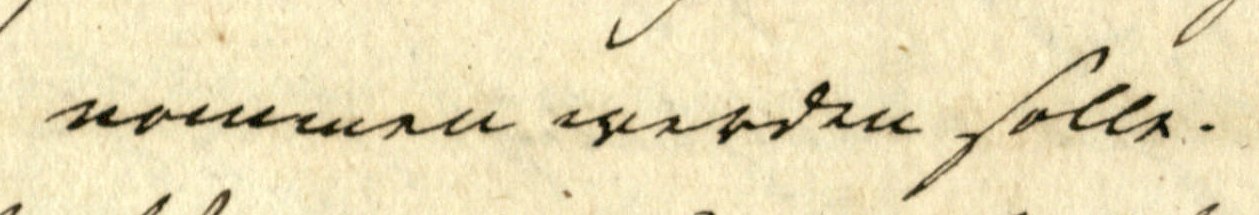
nommen werden solle.
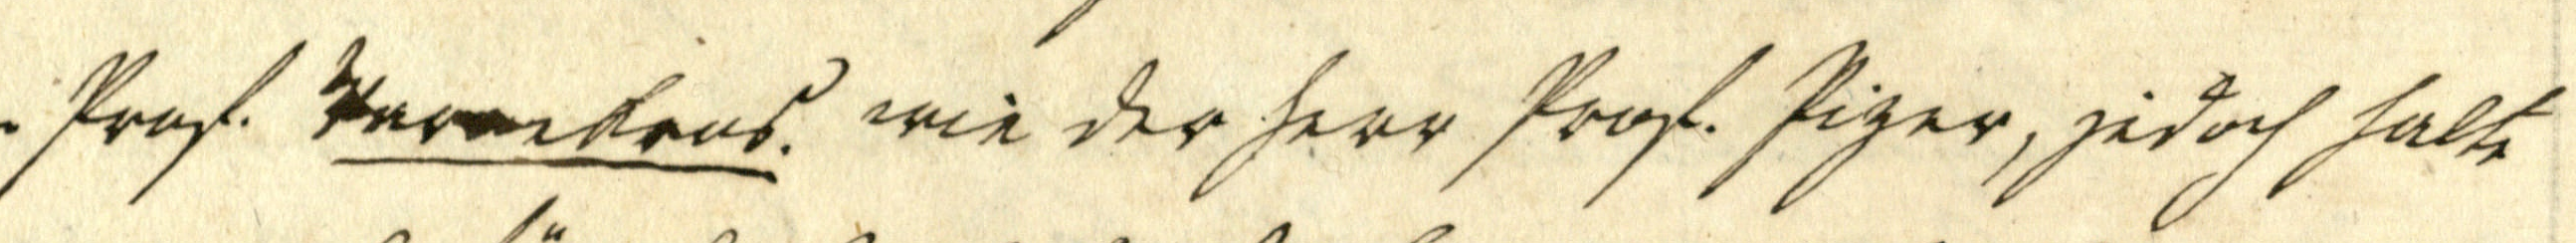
Prof. Warnekros. wie der herr Prof. Piper, jedoch halte
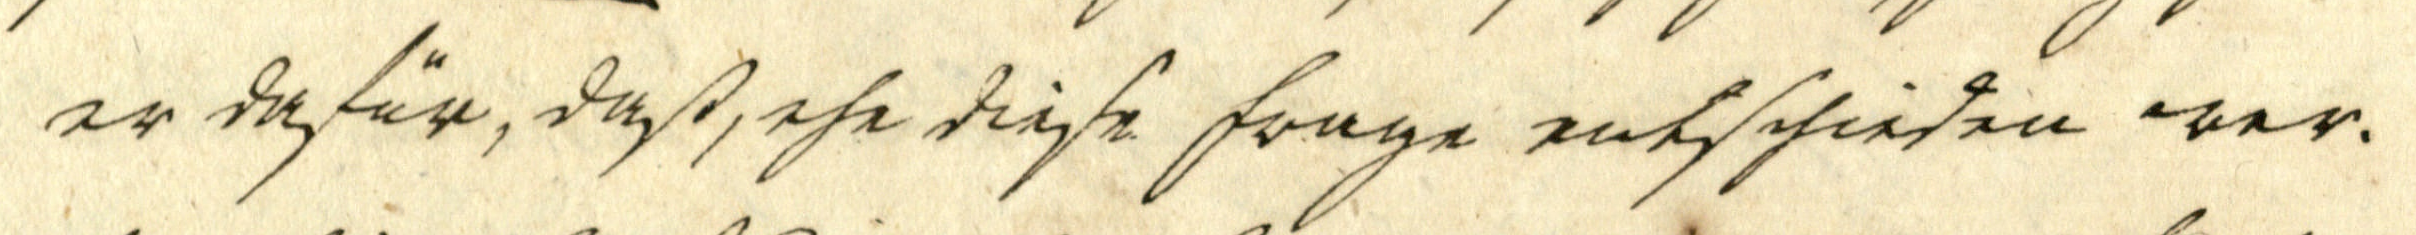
er dafür, daß, ehe diese Frage entschieden wer¬
